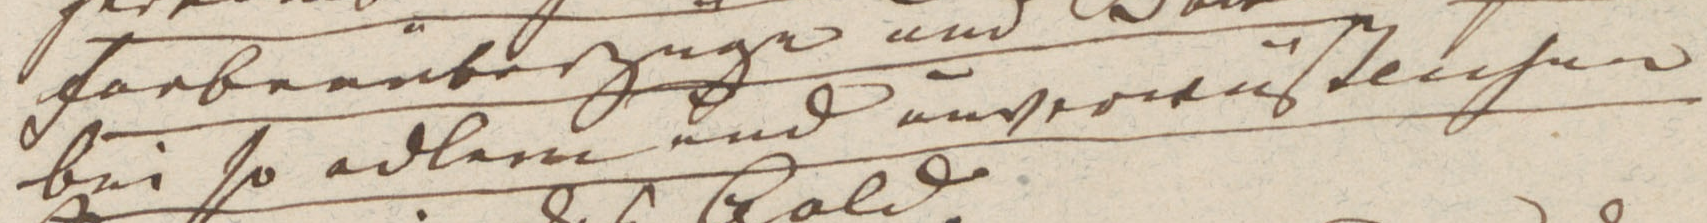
bei so edlem und unverwüstlichen
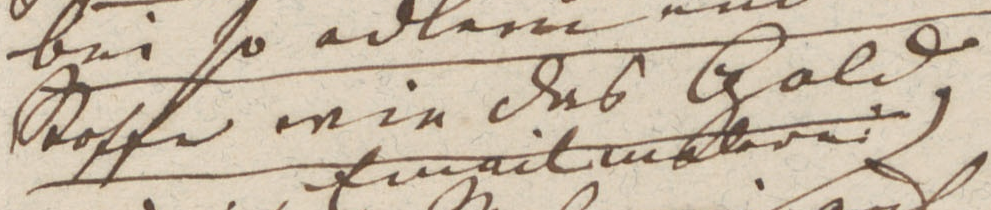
Stoffe wie das Gold.
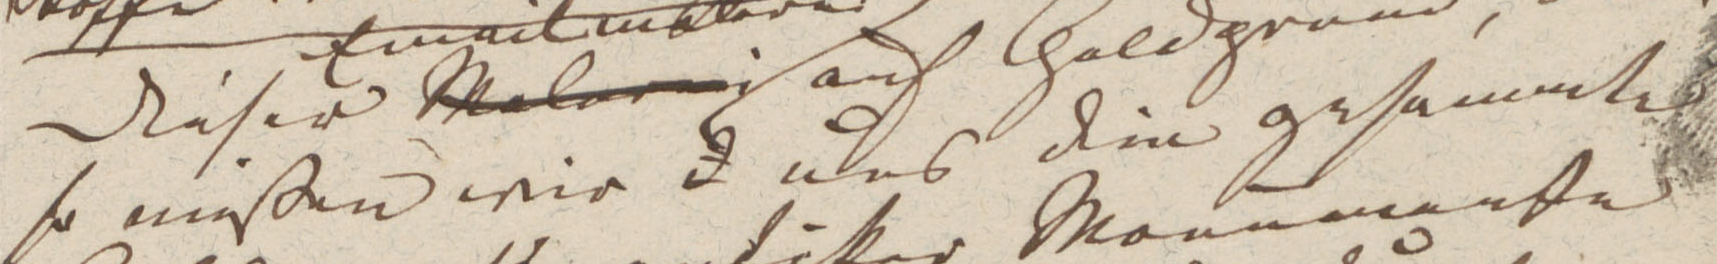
so müssen wir d uns die gesammte
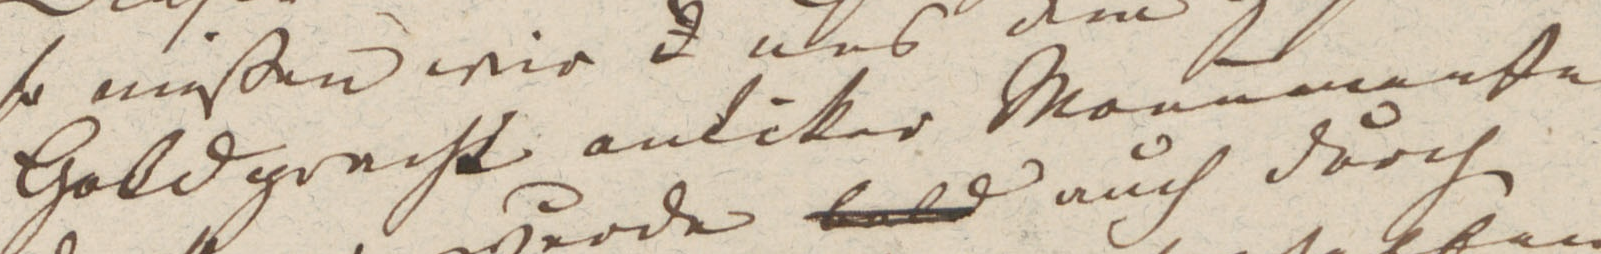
Goldpracht antiker Monumente
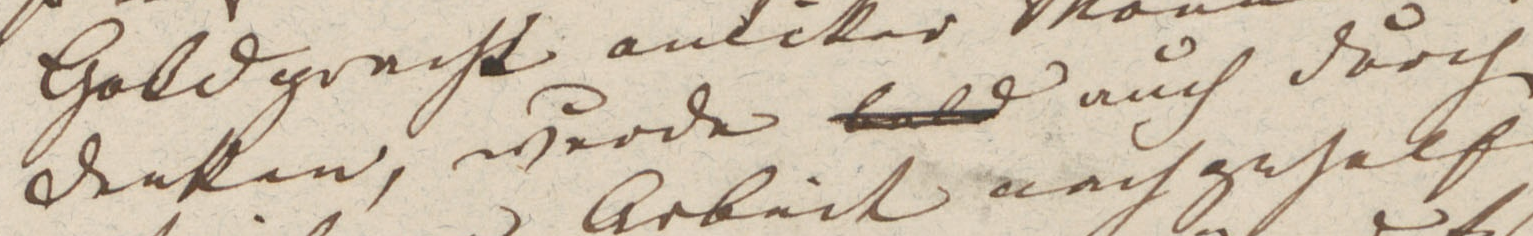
denken, wurde bald auch durch
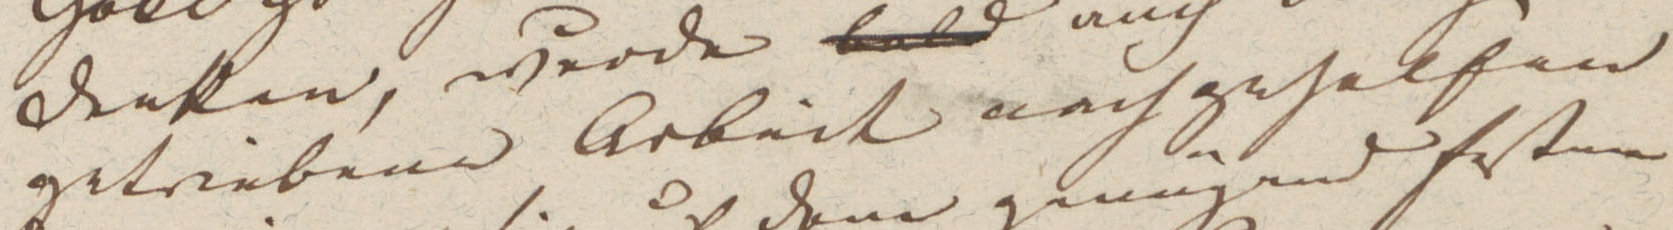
getriebene Arbeit nachgeholfen
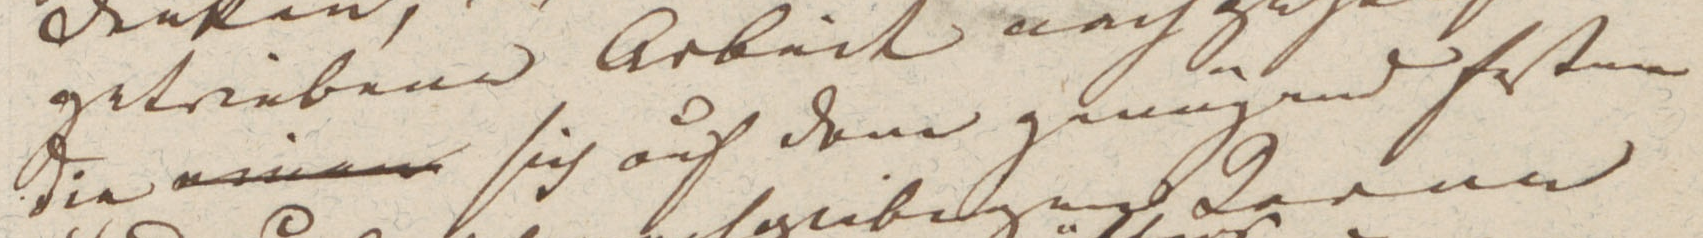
die einem sich auf dem genügend festen
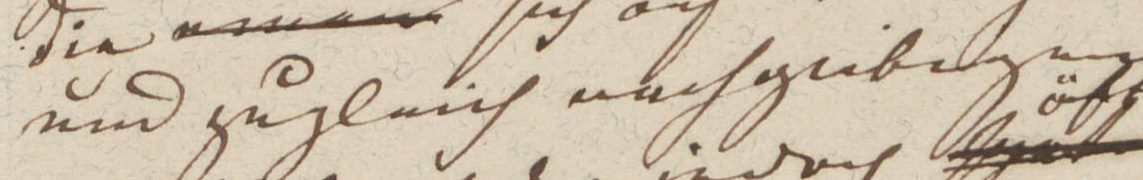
und zugleich nachgiebigen
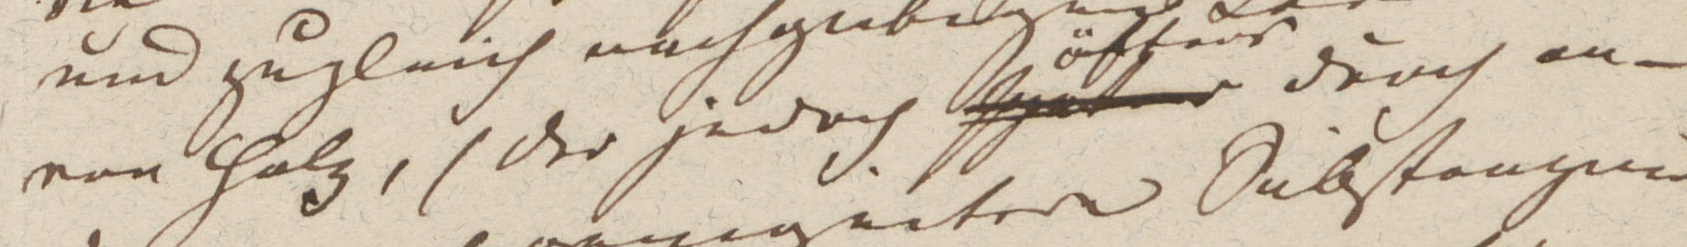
von Holz, (der jedoch später öfters durch an-
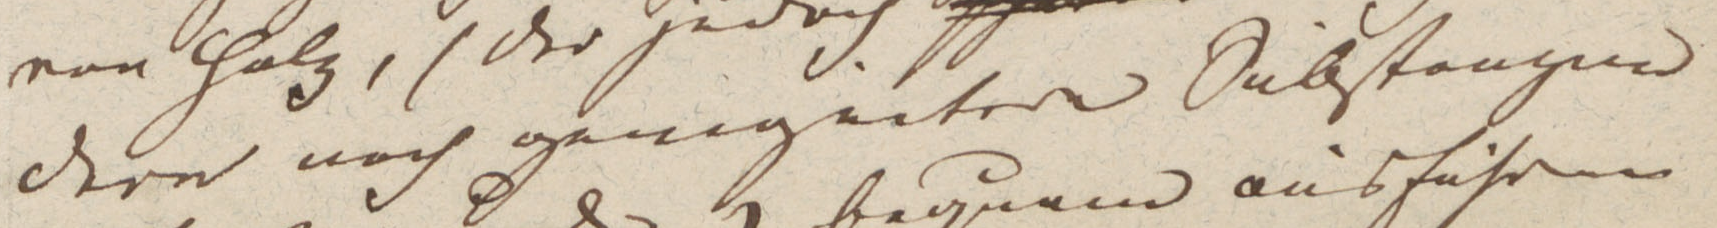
dere noch geeignetere Substanzen
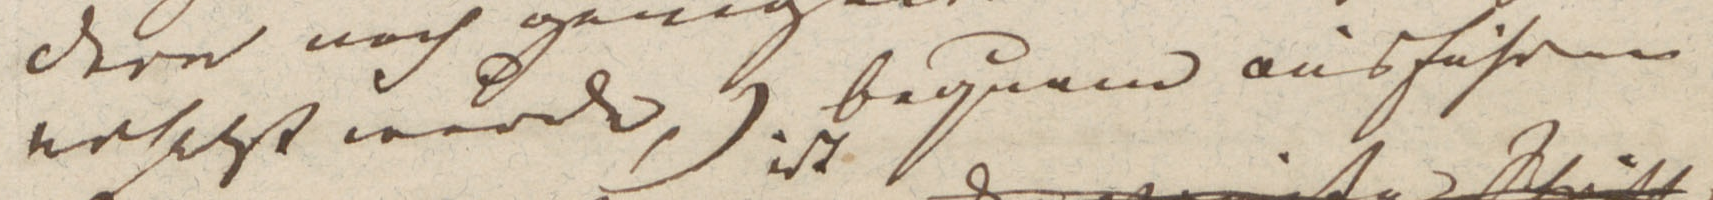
ersetzt wurde,) bequem ausführen
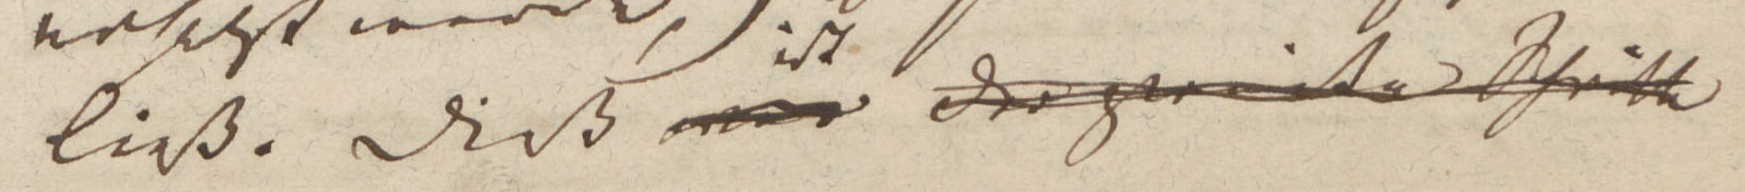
liess. Diess war ist der zweite Schritt
